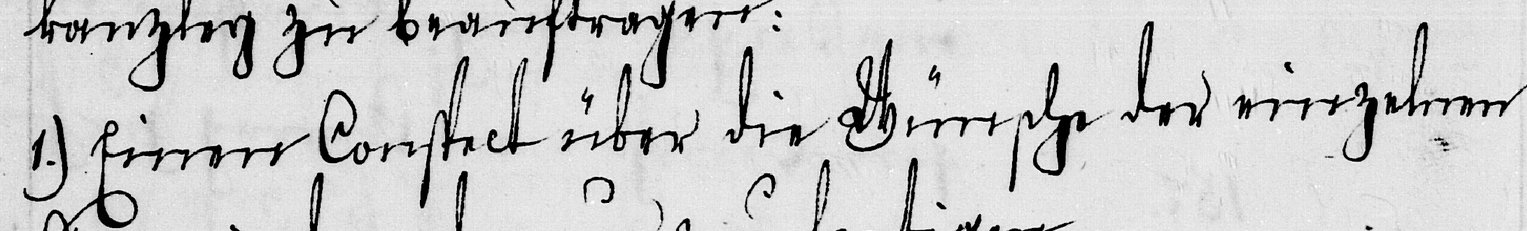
1.) Einen Conspect über die Wünsche der einzelnen
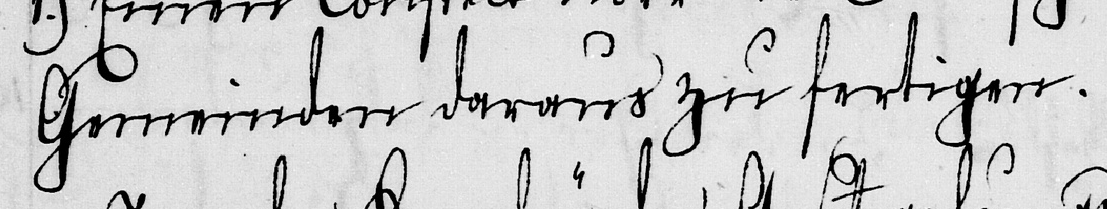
Gemeinden daraus zu fertigen.
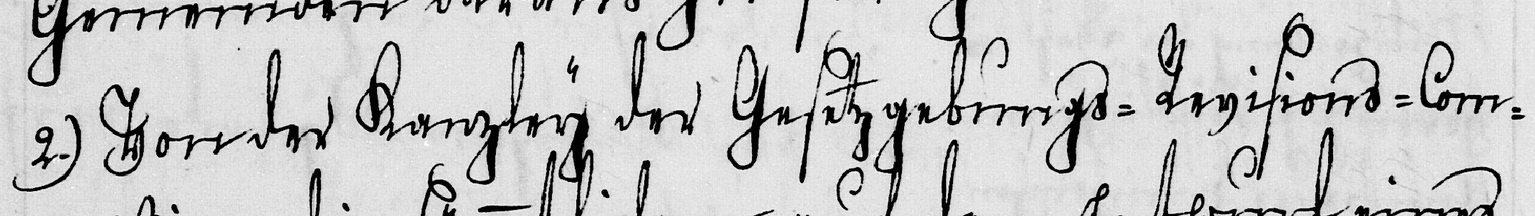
2.) Von der Kanzley der Gesetzesgebungs-Revisions-Com¬
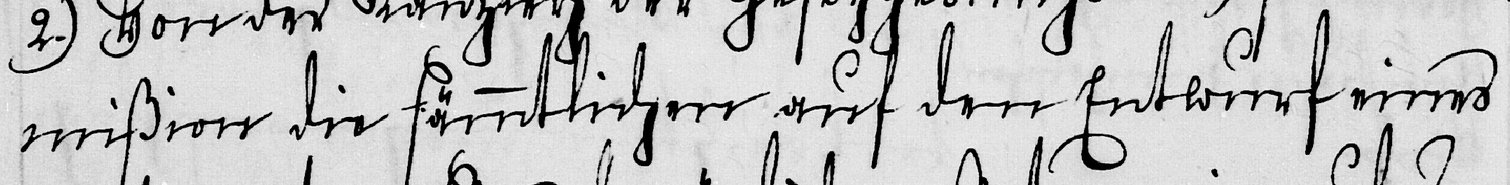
mißion die sämmtlichen auf den Entwurf eines
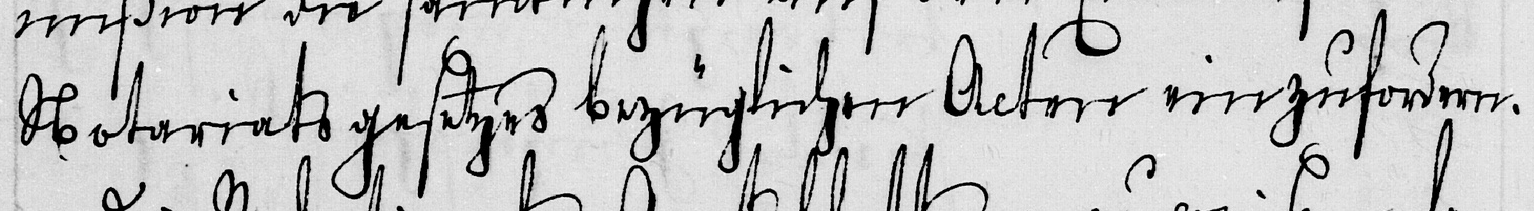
Notariatsgesetzes bezüglichen Acten einzufordern.
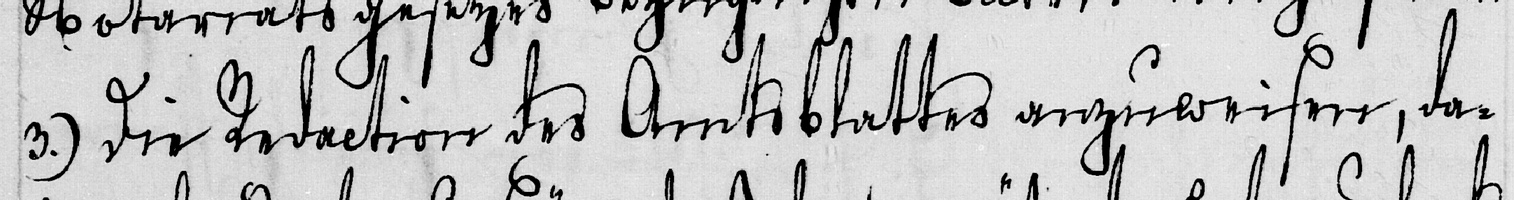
3.) Die Redaction des Amtsblattes anzuweisen, da¬
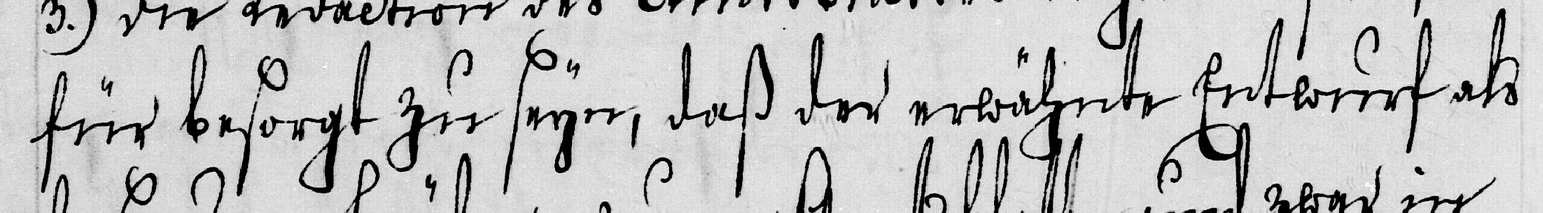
für besorgt zu seyn, daß der erwähnte Entwurf als
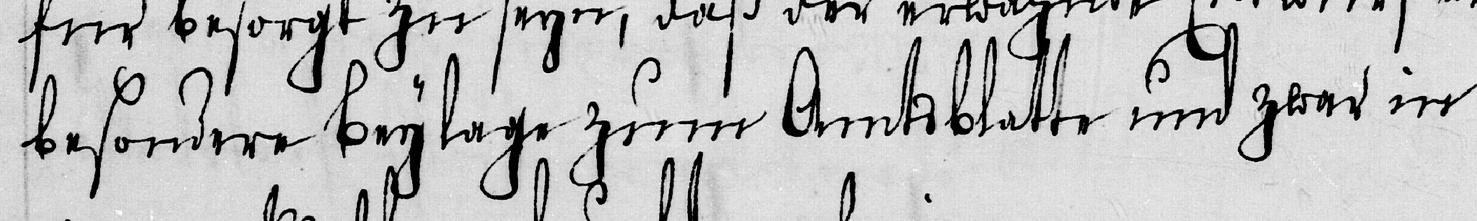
besondere Beylage zum Amtsblatte und zwar in
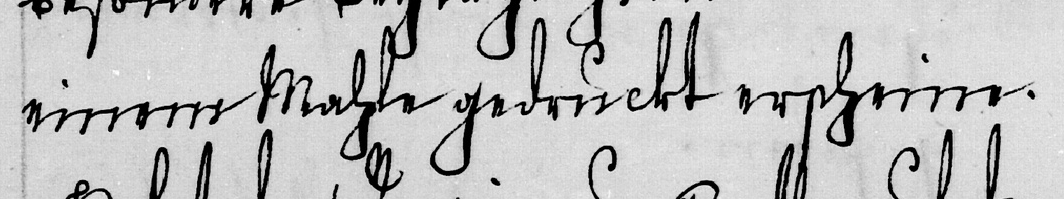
einem Mahle gedruckt erscheine.
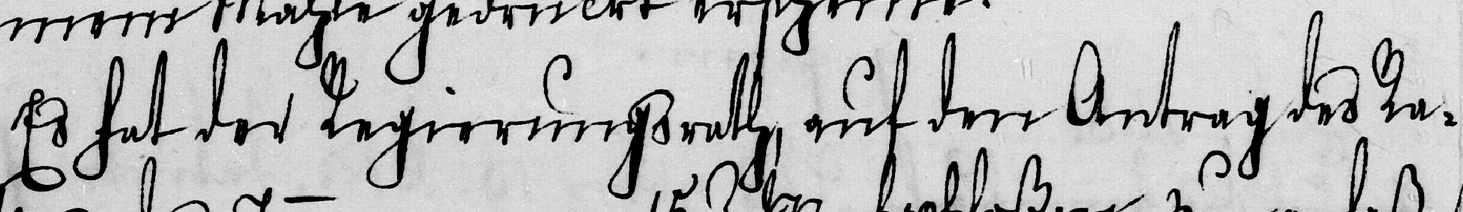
Es hat der Regierungsrath, auf den Antrag des R¬
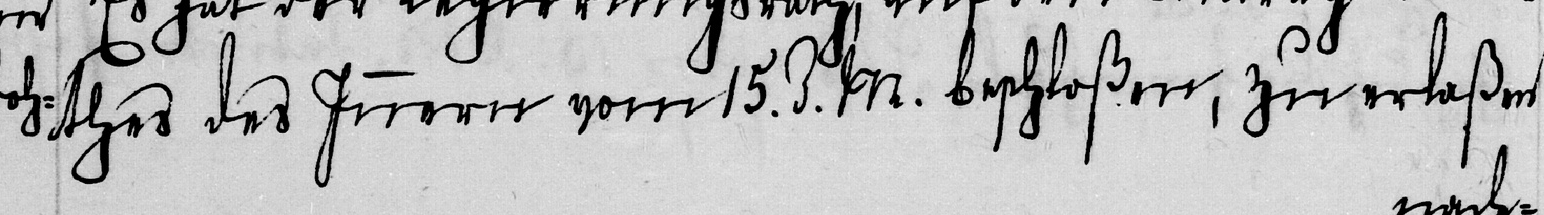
athes des Innern vom 15. d. M. beschloßen, zu erlaßen
